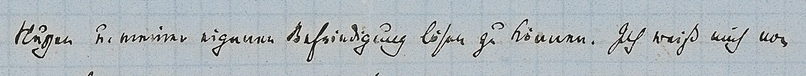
Nutzen u. meiner eigenen Befriedigung lösen zu können. Ich weiß mich von
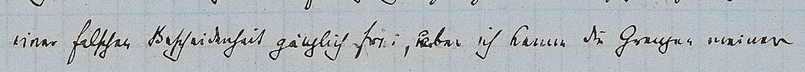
einer falschen Bescheidenheit gänzlich frei, aber ich kenne die Grenzen meiner
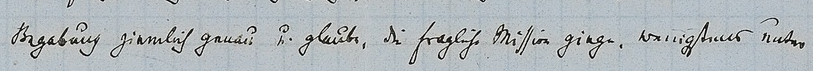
Begabung ziemlich genau u. glaube, die fragliche Mission ginge, wenigstens unter
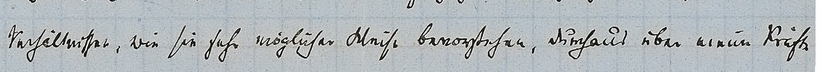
Verhältnissen, wie sie sehr möglicher Weise bevorstehen, durchaus über meine Kräfte
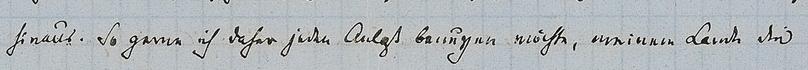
hinaus. So gerne ich daher jeden Anlaß benutzen möchte, meinem Lande die
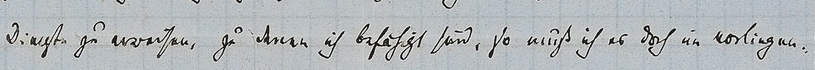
Dienste zu erweisen, zu denen ich befähigt s...d, so muß ich es doch im vorliegen-
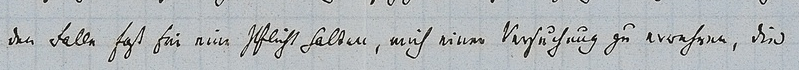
den Falle fast für eine Pflicht halten, mich einer Versuchung zu erwehren, die
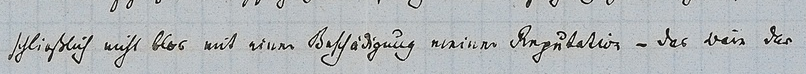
schließlich nicht blos mit einer Beschädigung meiner Reputation – das wäre das
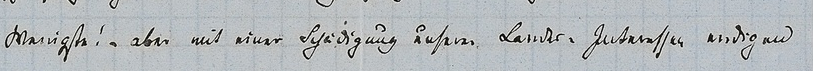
Wenigste! – aber mit einer Schädigung unserer Landes-Interessen endigen
